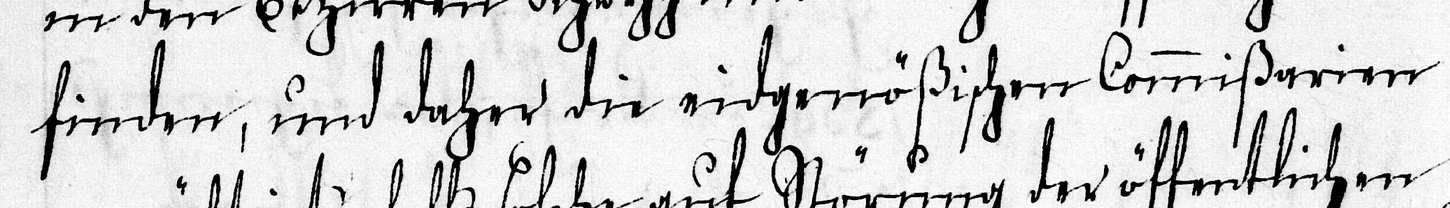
finden, und daher die eidgenößischen Commißarien
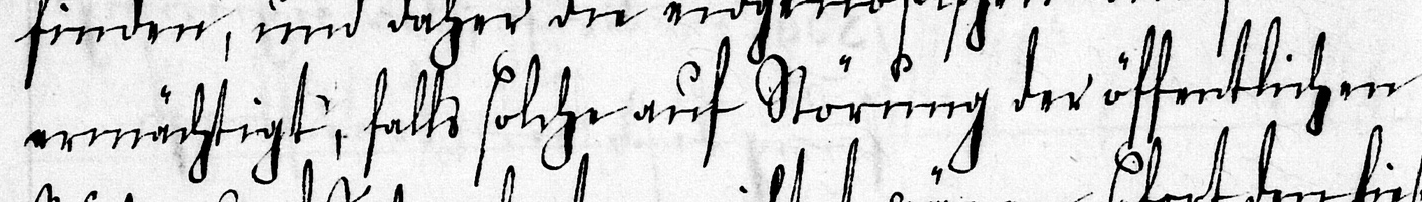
ermächtigt, falls solche auf Störung der öffentlichen
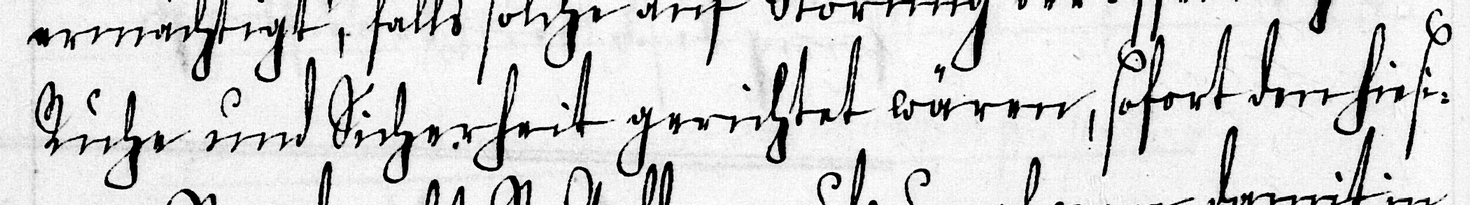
Ruhe und Sicherheit gerichtet wären, sofort den hies¬
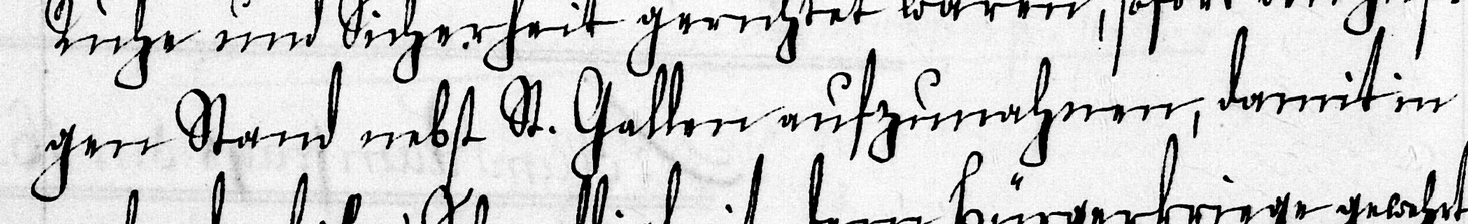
igen Stand nebst St. Gallen aufzumahnen, damit in
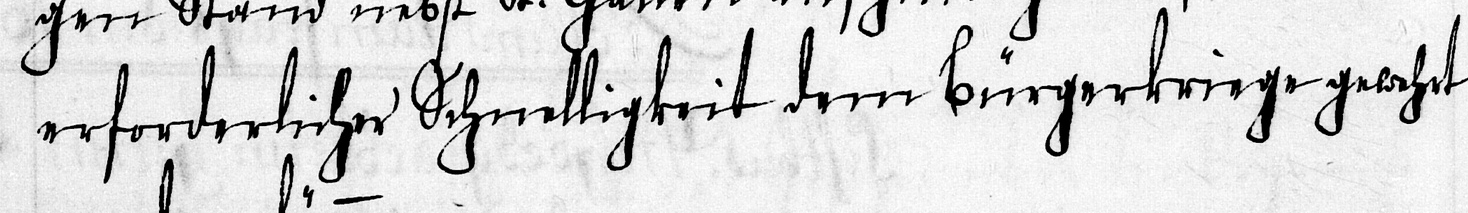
erforderlicher Schnelligkeit dem Bürgerkriege gewehrt
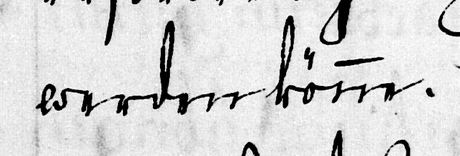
werden könne.
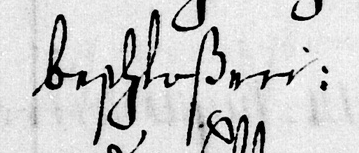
beschloßen:
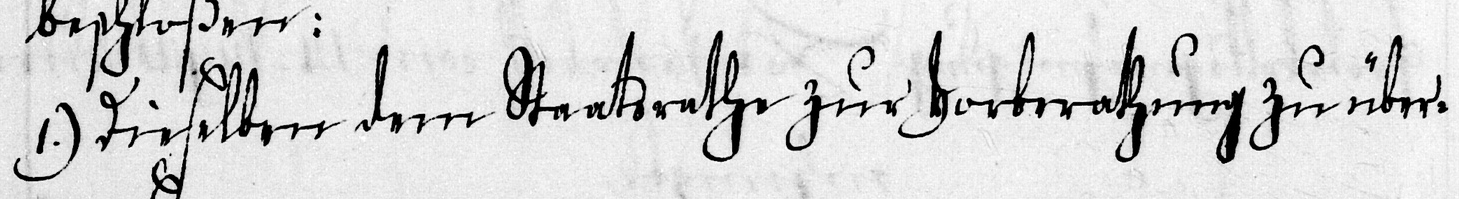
1.) Dieselben dem Staatsrathe zur Vorberathung zu über¬
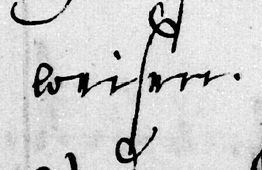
weisen.
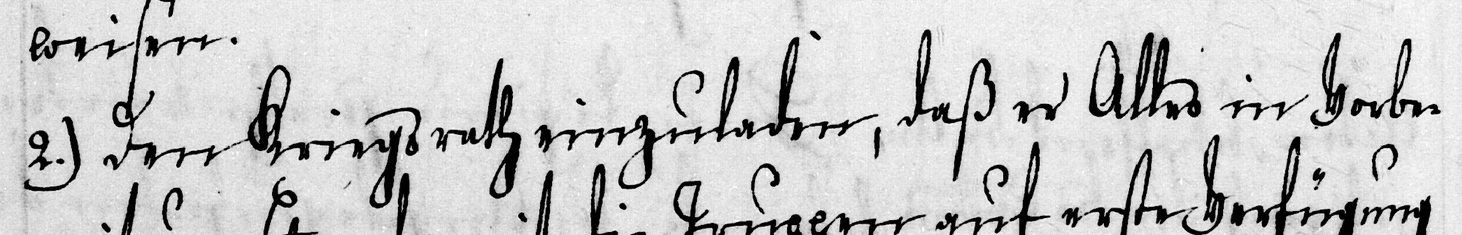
2.) Den Kriegsrath einzuladen, daß er Alles in Vorbe¬
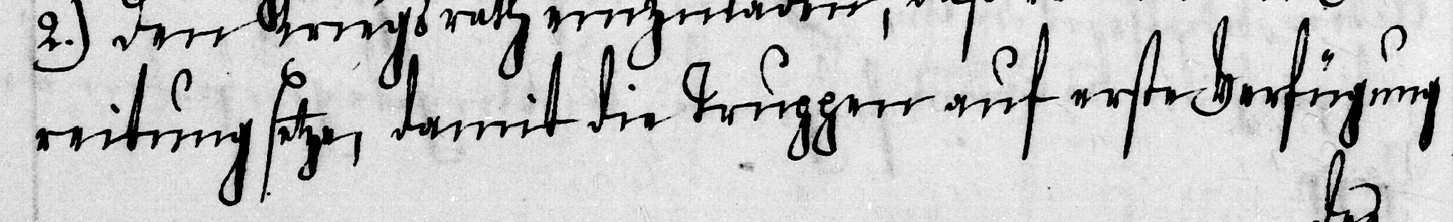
reitung setze, damit die Truppen auf erste Verfügung
